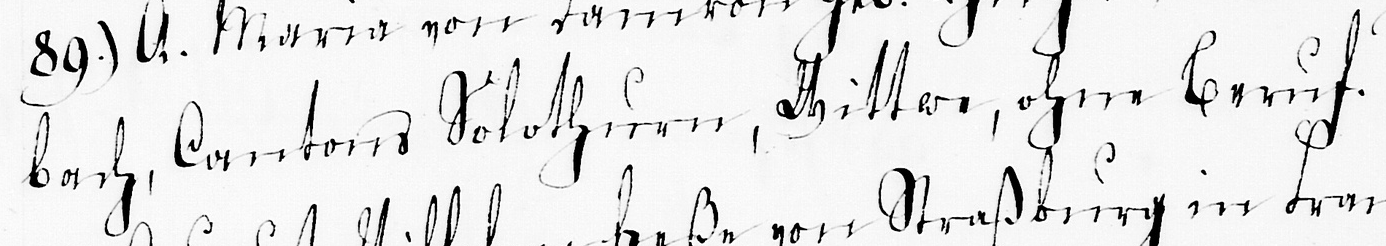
bach, Cantons Solothurn, Wittwe, ohne Beruf.
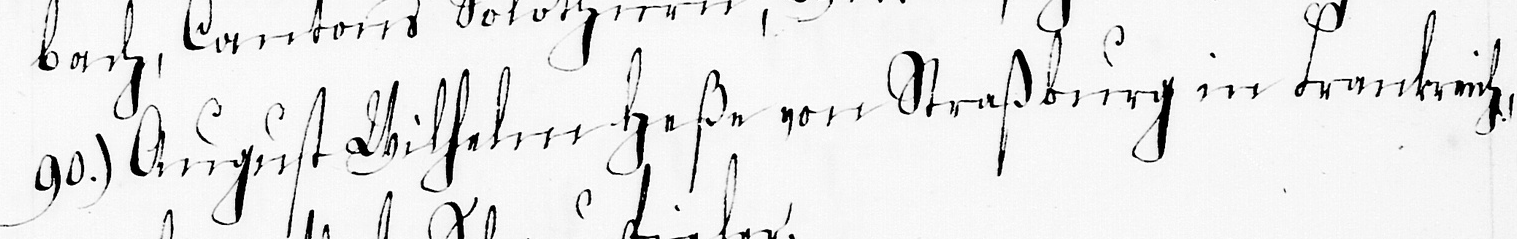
90.) August Wilhelm Heße von Straßburg in Frankrei¬
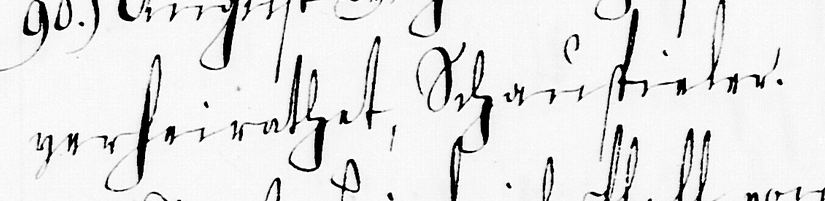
verheirathet, Schauspieler.
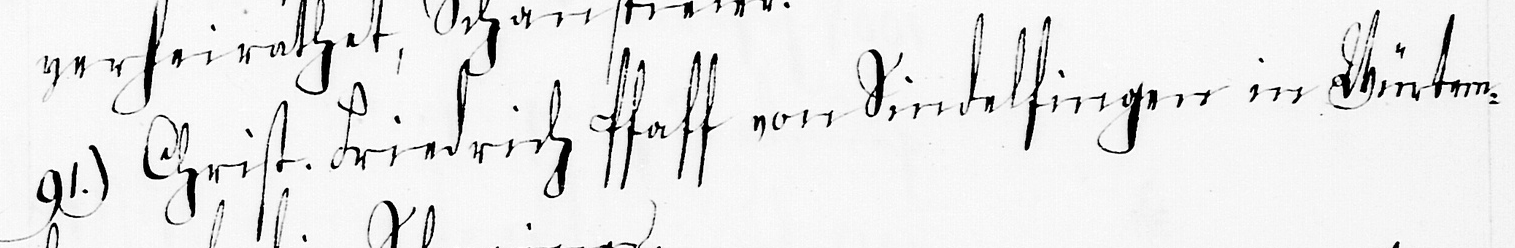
91.) Christ. Friedrich Pfaff von Sindelfingen in Würtem¬
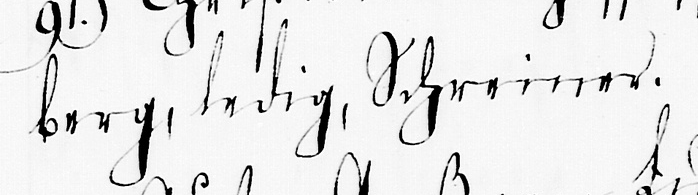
berg, ledig, Schreiner.
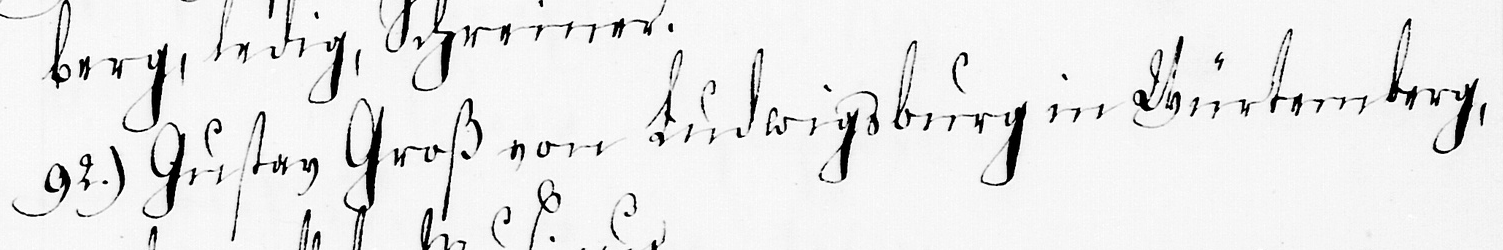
92.) Gustav Groß von Ludwigsburg in Würtemberg,
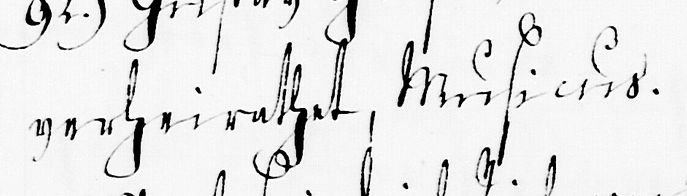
verheirathet, Musicus.
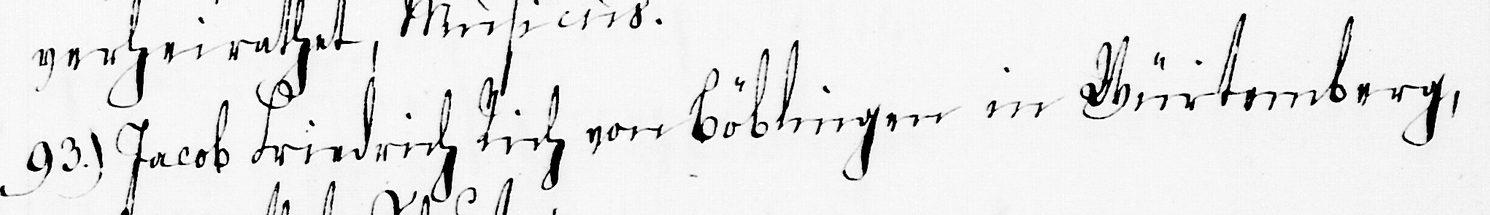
93.) Jacob Friedrich Rich von Böblingen in Würtemberg,
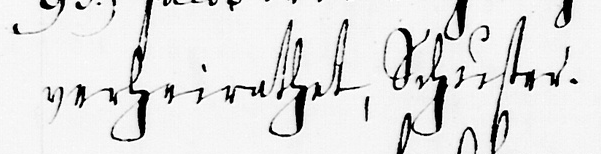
verheirathet, Schuster.
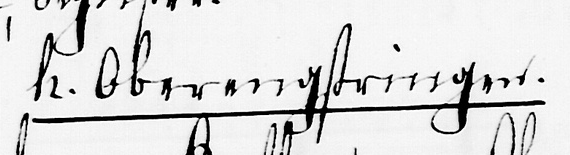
h. Oberengstringen.
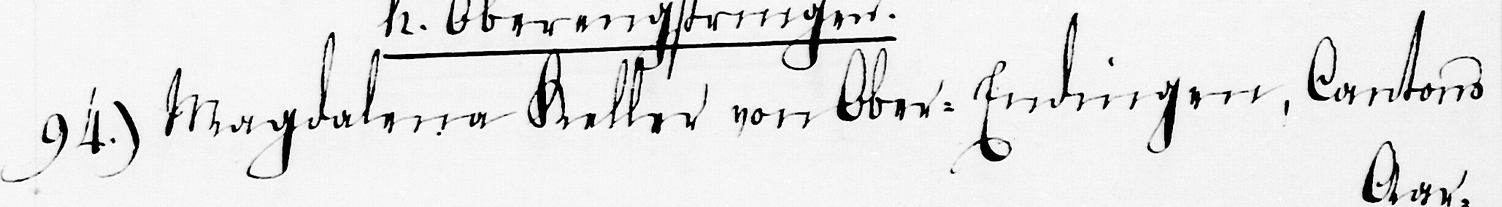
94.) Magdalena Keller von Ober-Endingen, Cantons
